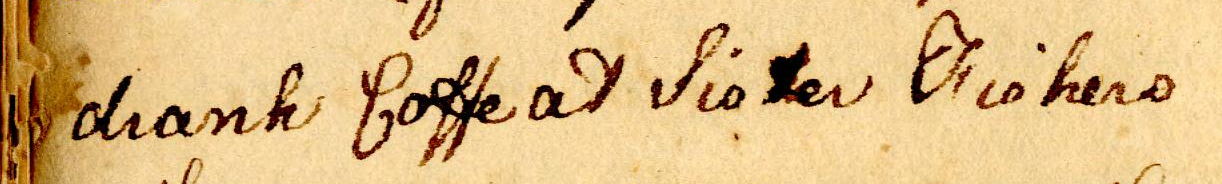drank Coffe at Sister Fishers
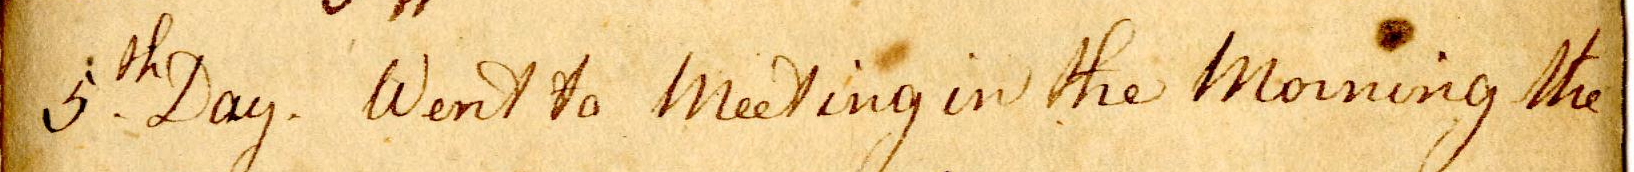5^th Day- Went to Meeting in the Morning the
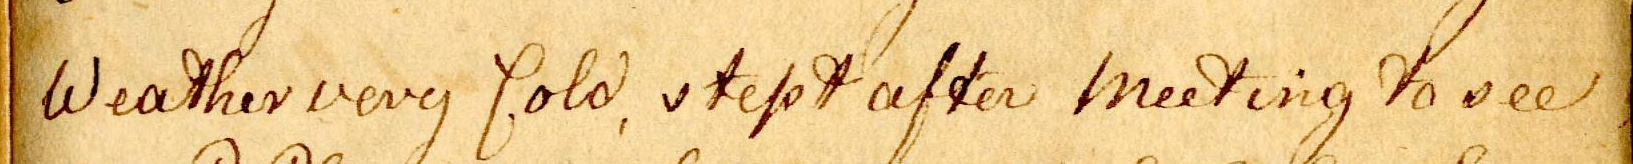Weather very Cold, stept after Meeting to see
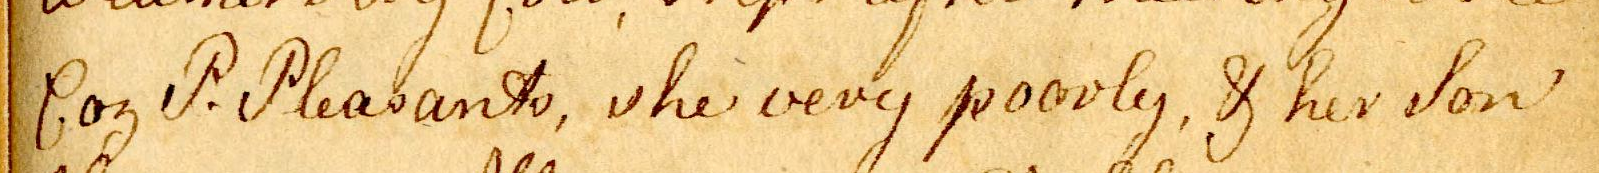Coz P. Pleasants, she very poorly, & her Son
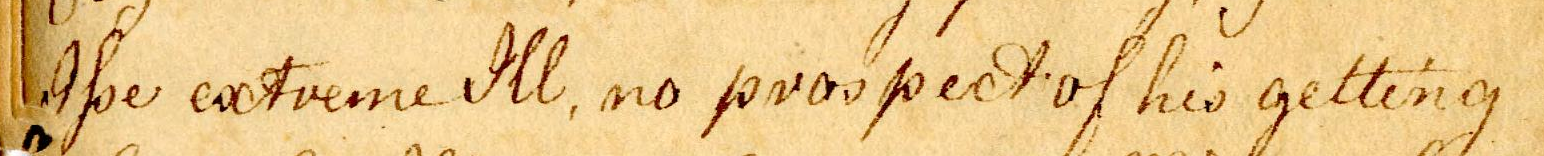Isse extreme Ill, no prospect of his getting
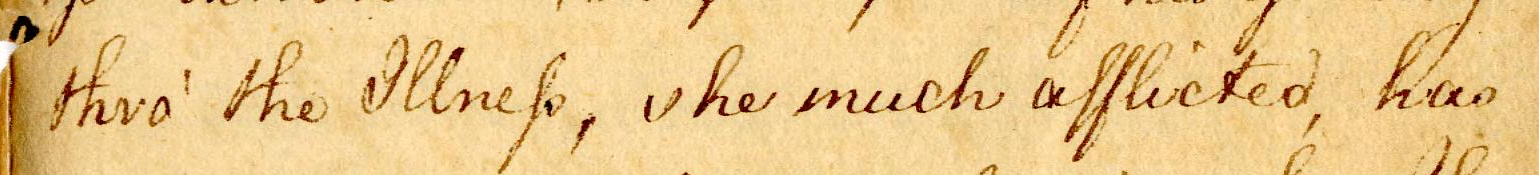thro' the Illness, she much afflicted, has
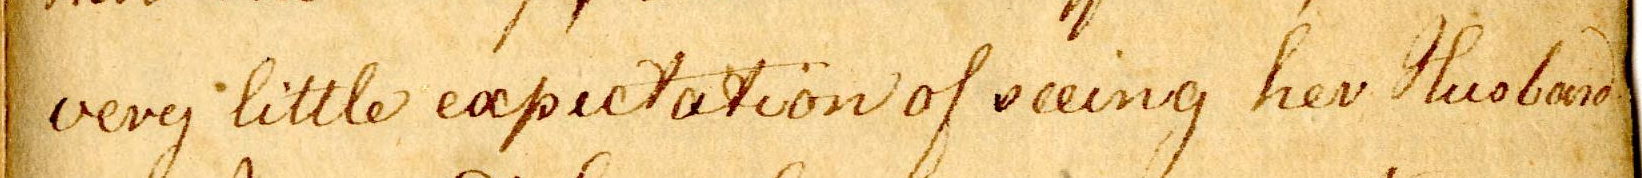very little expectation of seeing her Husband
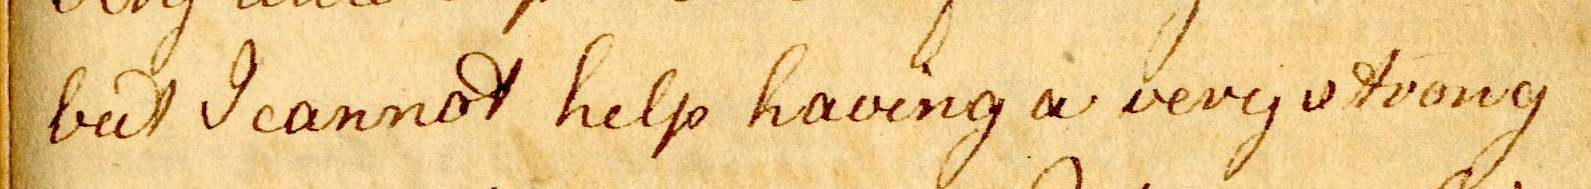but I cannot help having a very strong
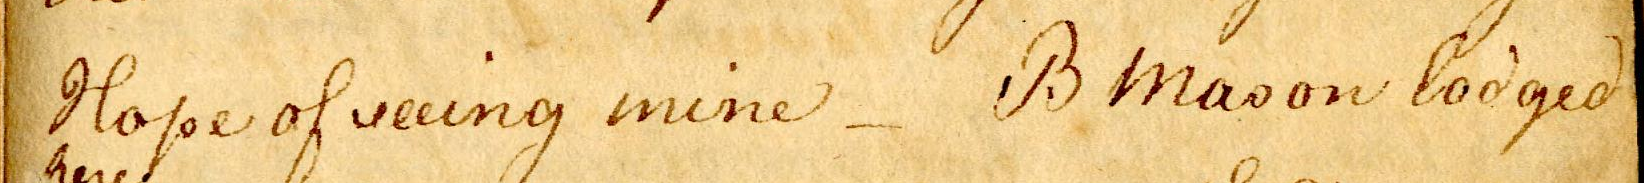Hope of seeing mine- B Mason lodged
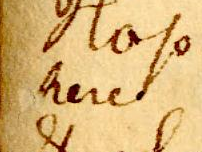here
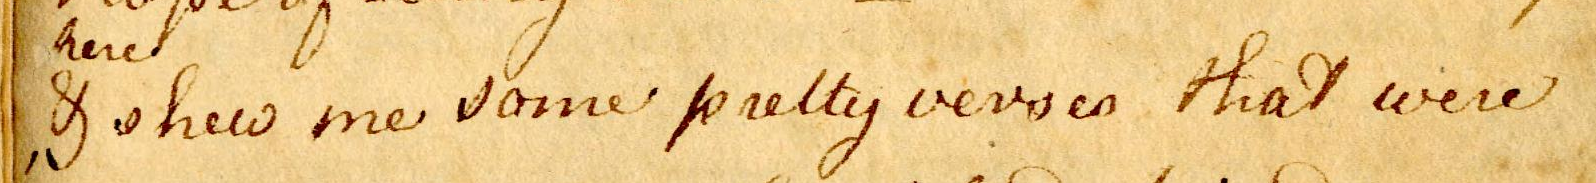& shew me some pretty verses that were
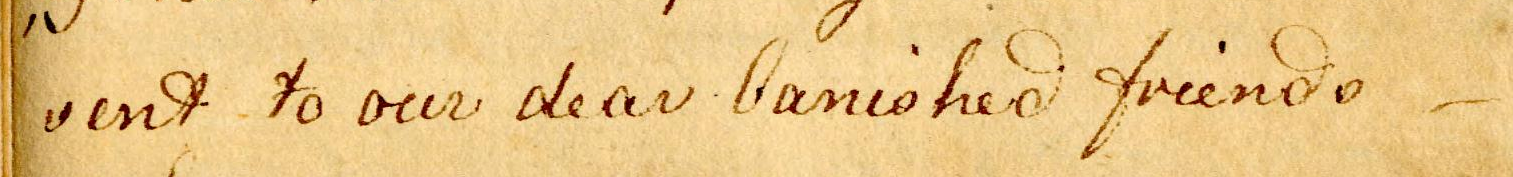sent to our dear banished friends-
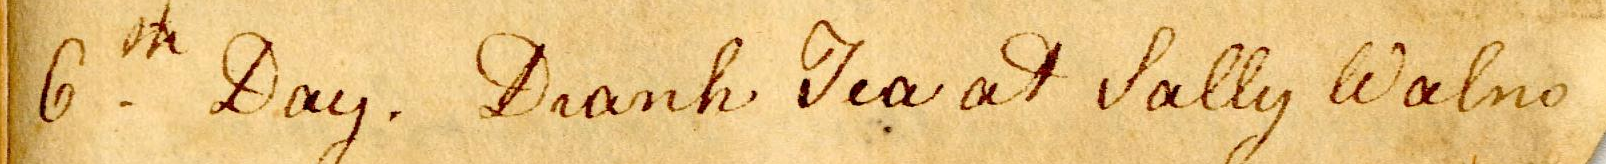6^th. Day. Drank Tea at Sally Walns
